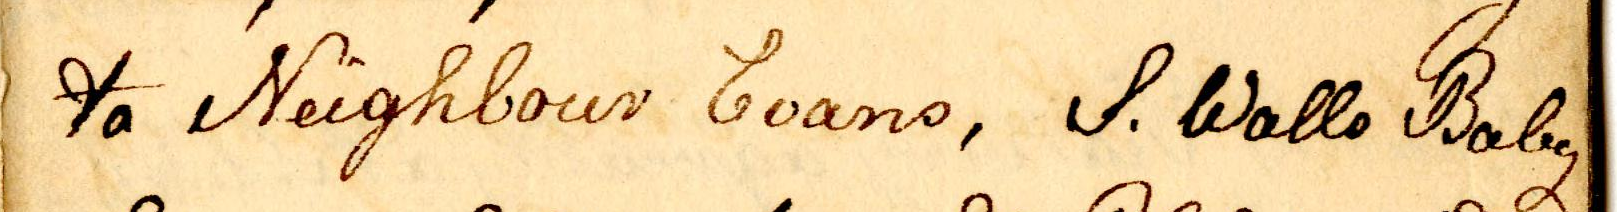to Neighbour Evans, S. Walls Baby
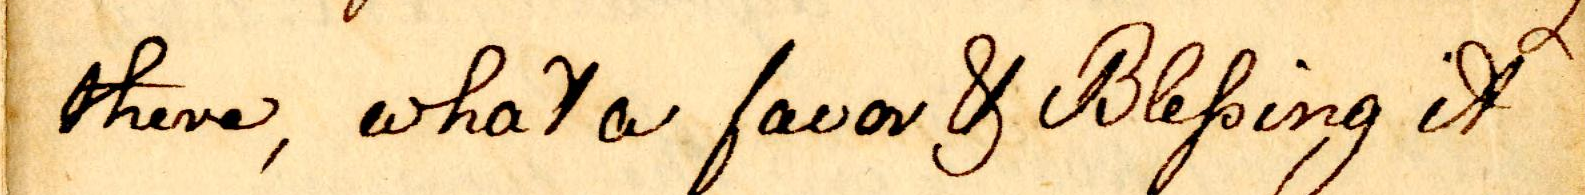there, what a favor & Blessing it
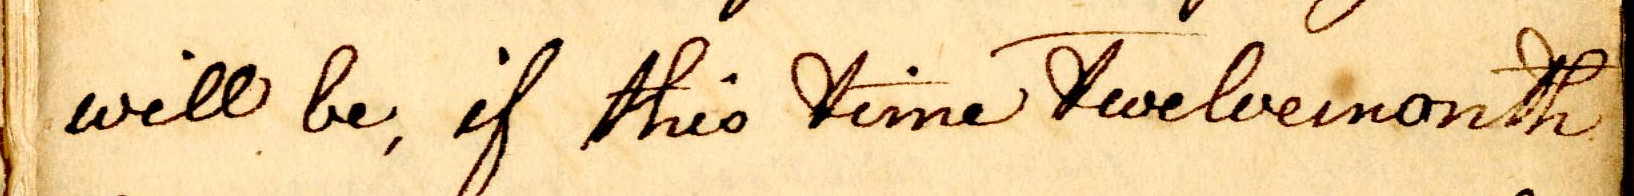will be, if this time twelvemonth
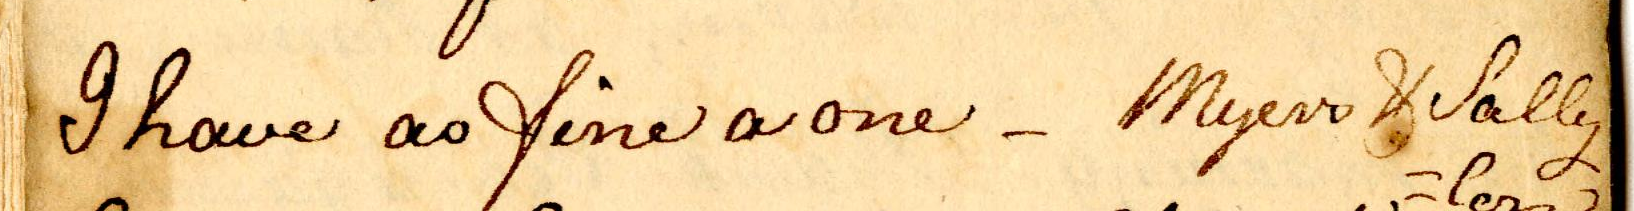I have as fine a one- Myers & Sally
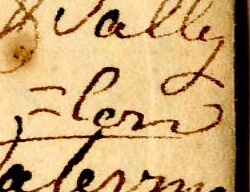-len
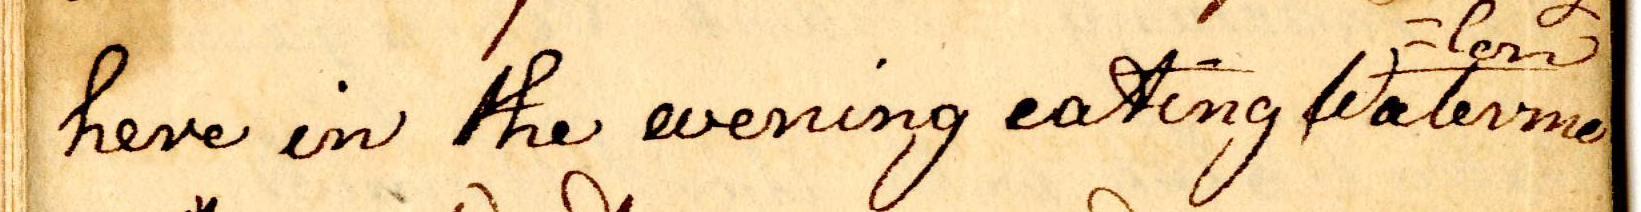here in the evening eating Waterme
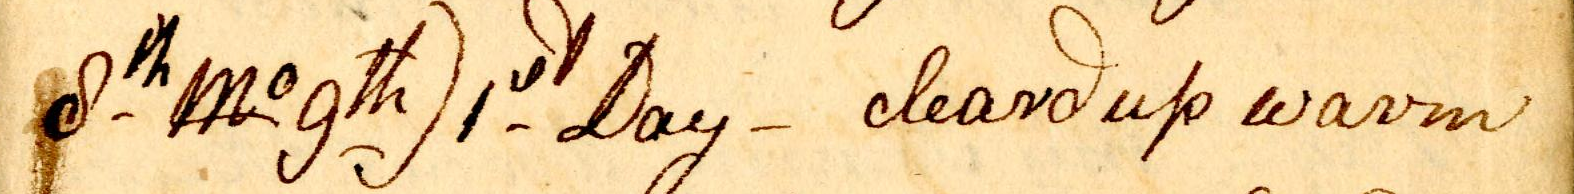8^th. M^o 9^th) 1^st Day- cleared up warm
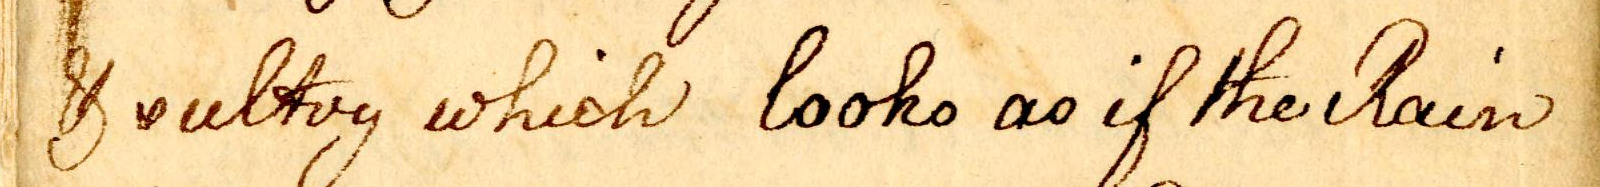& sultry which looks as if the Rain
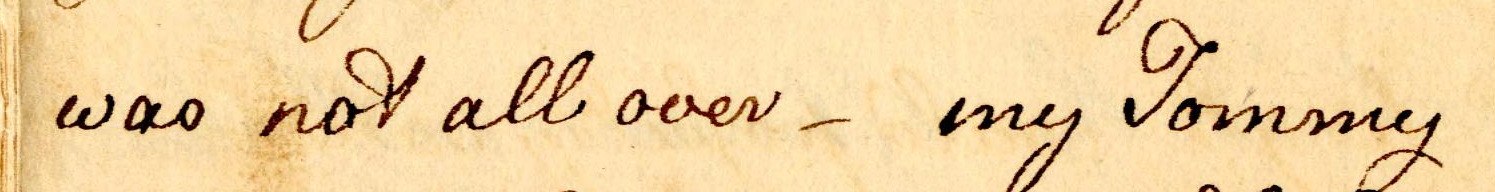was not all over- my Tommy
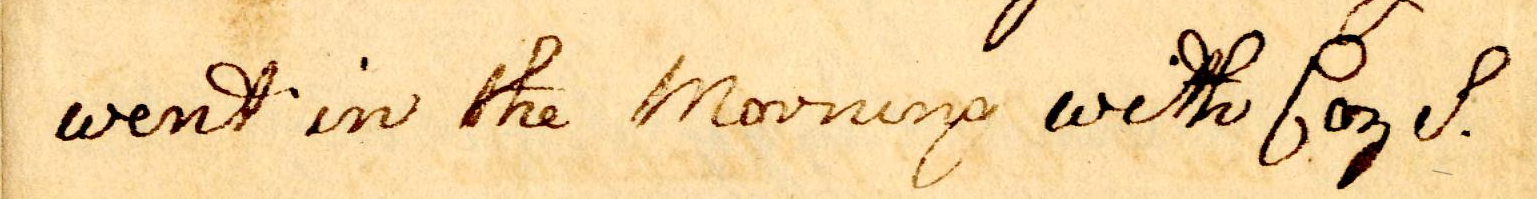went in the Morning with Coz S.
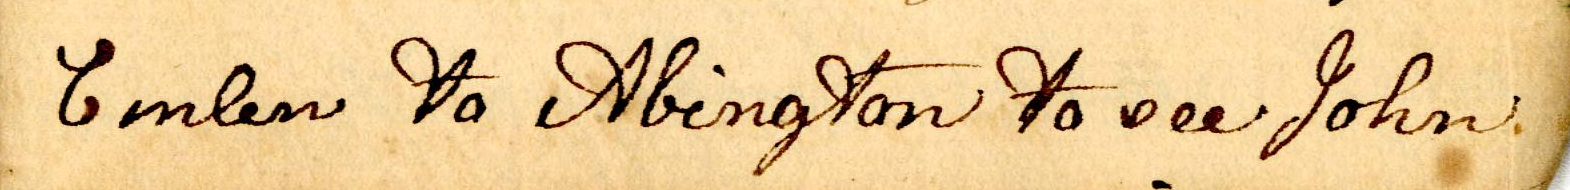Emlen to Abington to see John
